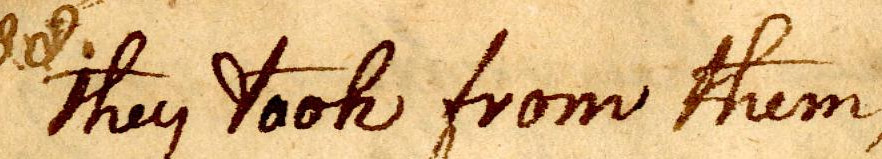They took from them,
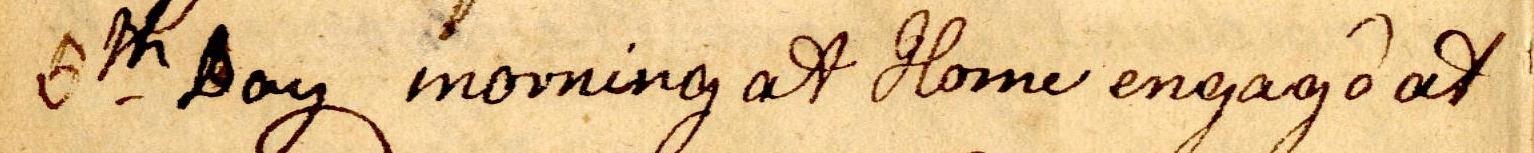5^th Day morning at Home engagd at
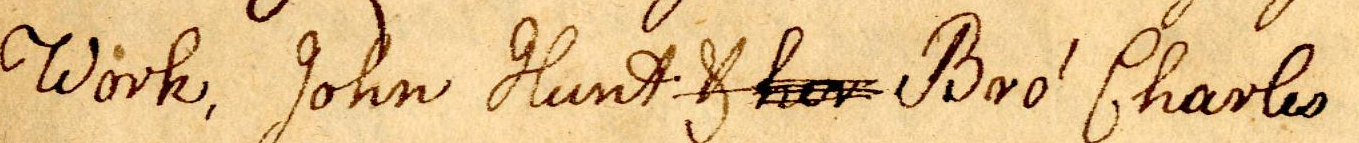Work, John Hunt & [her] Bro' Charles
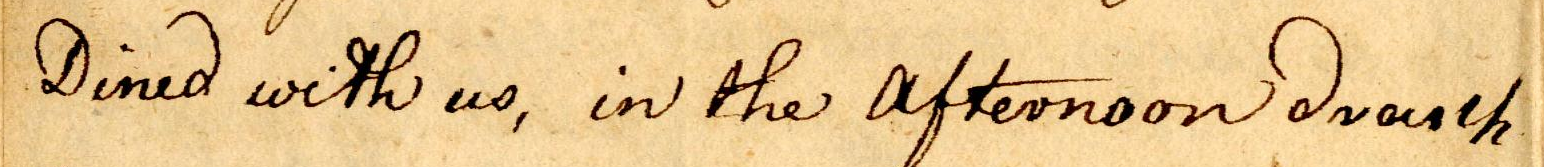Dined with us, in the Afternoon drank
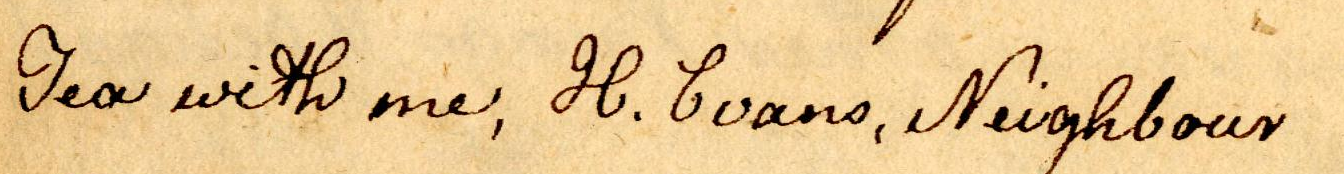Tea with me, H. Evans, Neighbour
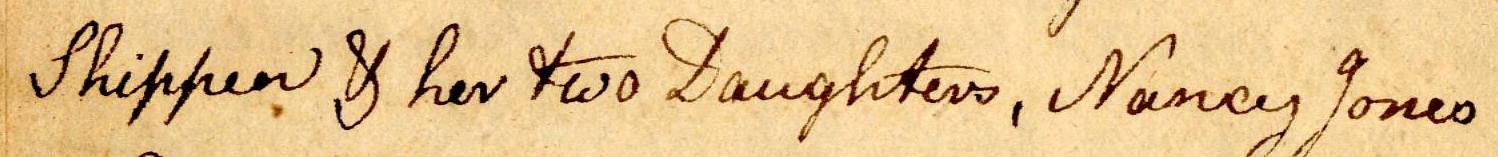Shippen & her two Daughters, Nancy Jones
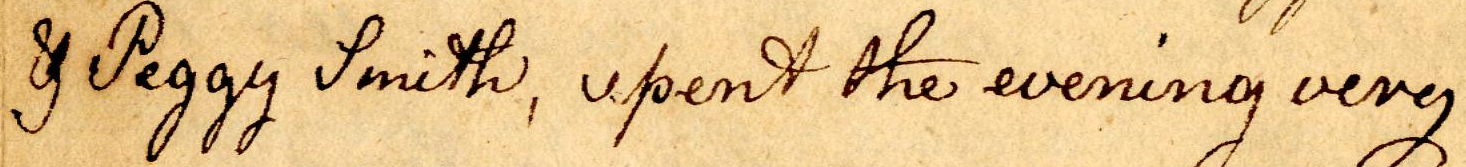& Peggy Smith, spent the evening very
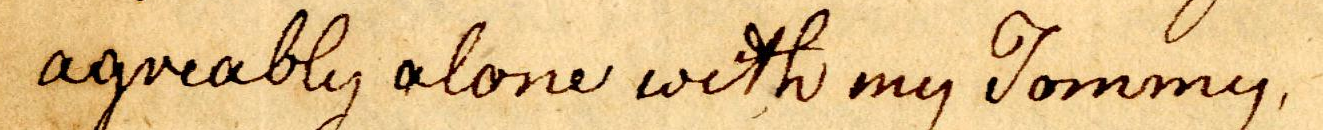agreably alone with my Tommy,
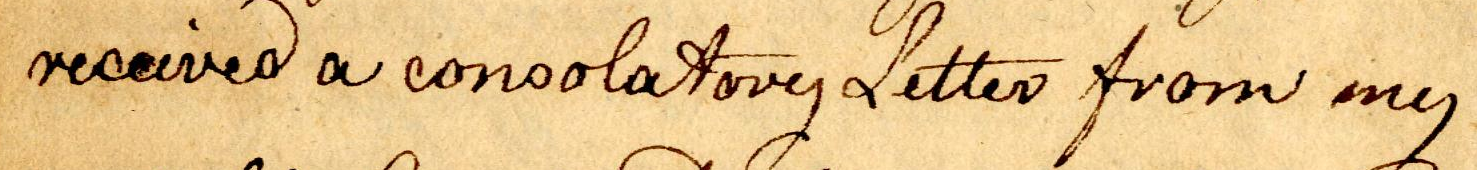received a consolatory Letter from my
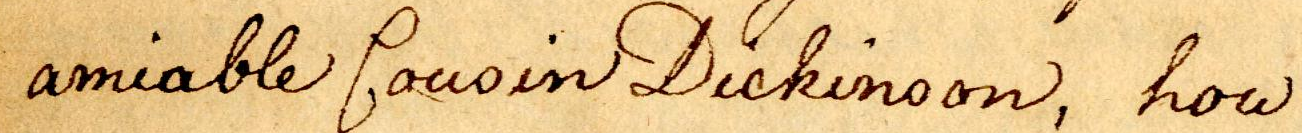amiable Cousin Dickinson, how
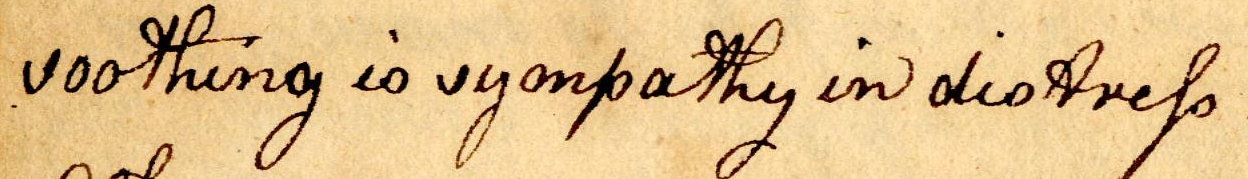soothing is sympathy in distress-
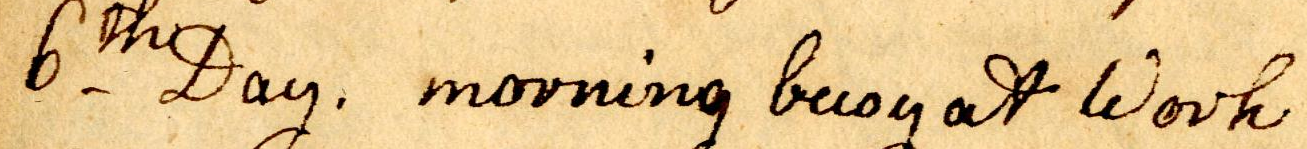6^th Day. morning busy at Work
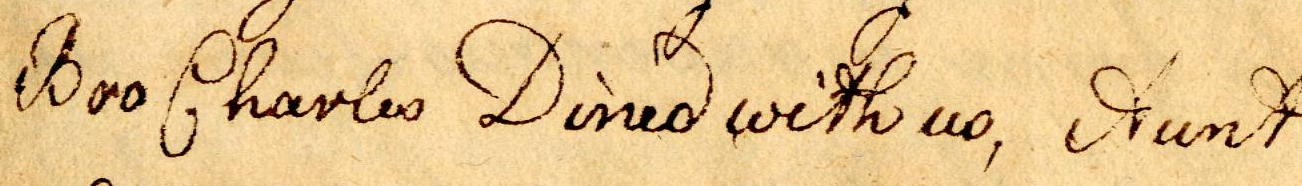Bro Charles Dined with us, Aunt
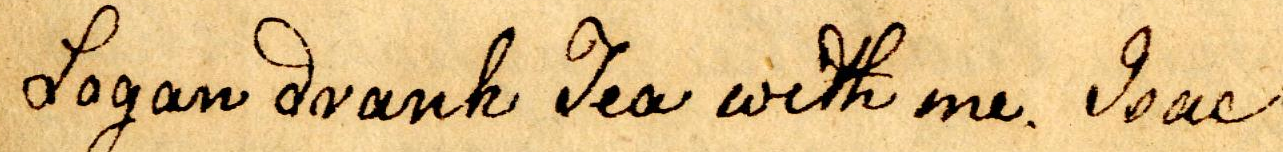Logan drank Tea with me. Isac
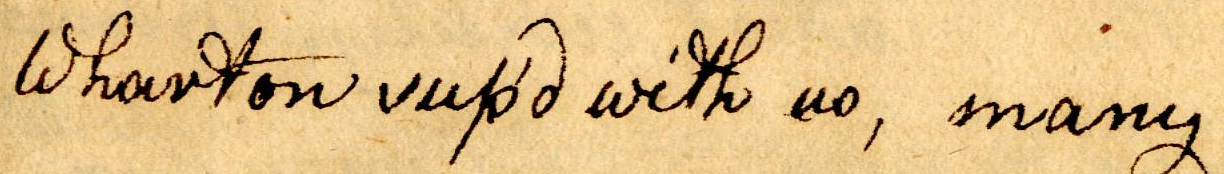Wharton sup'd with me, many
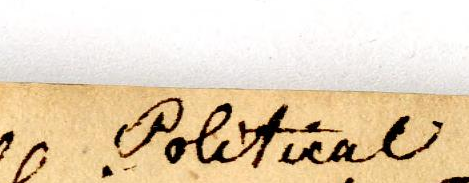Political
